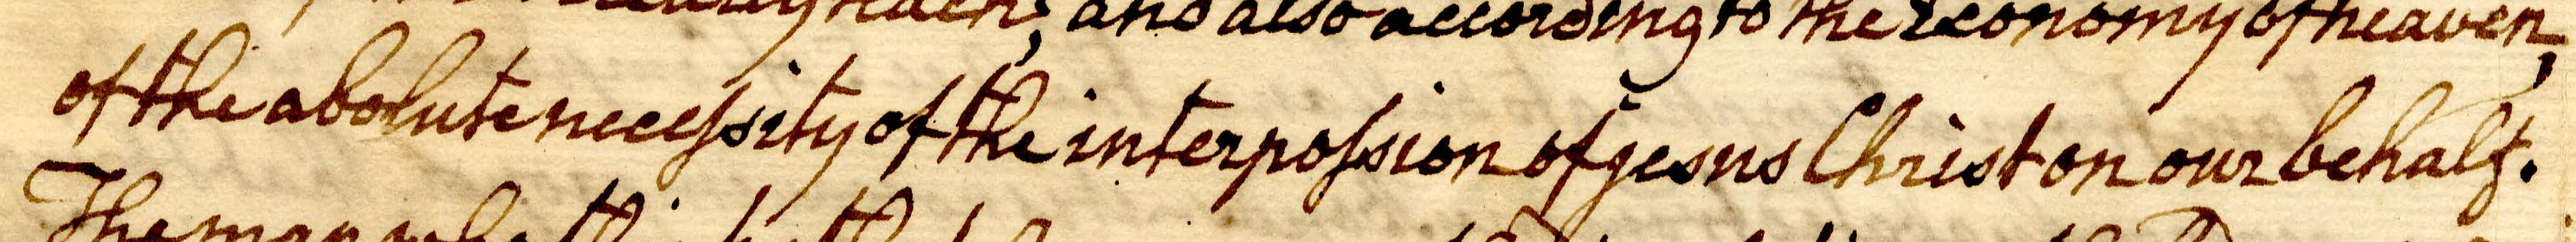of the absolute necessity of the interpossion of jesus Christ on our behalf.
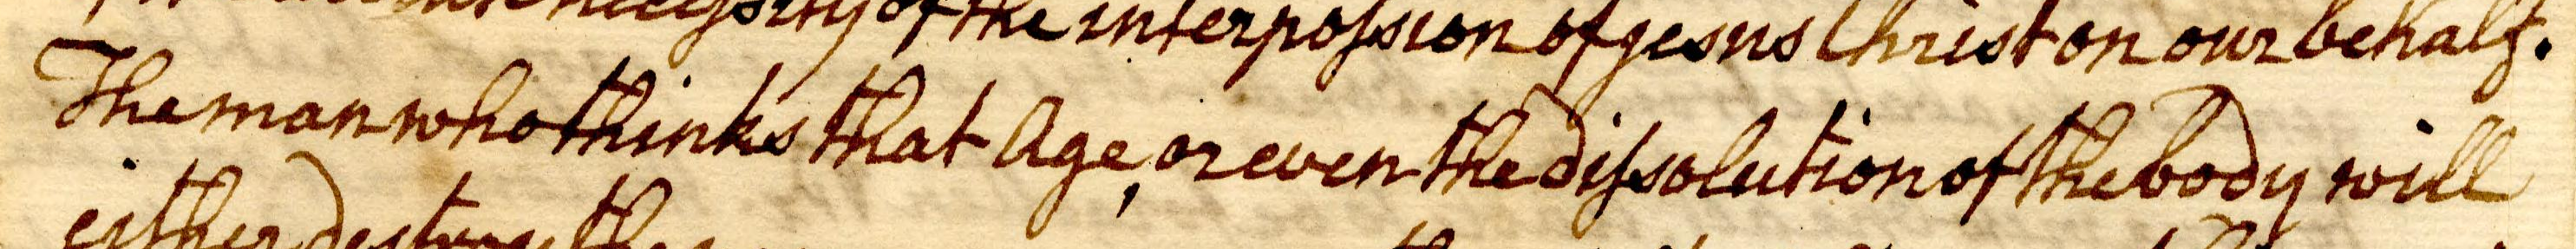The man who thinks that Age, or even the dissolution of the body will
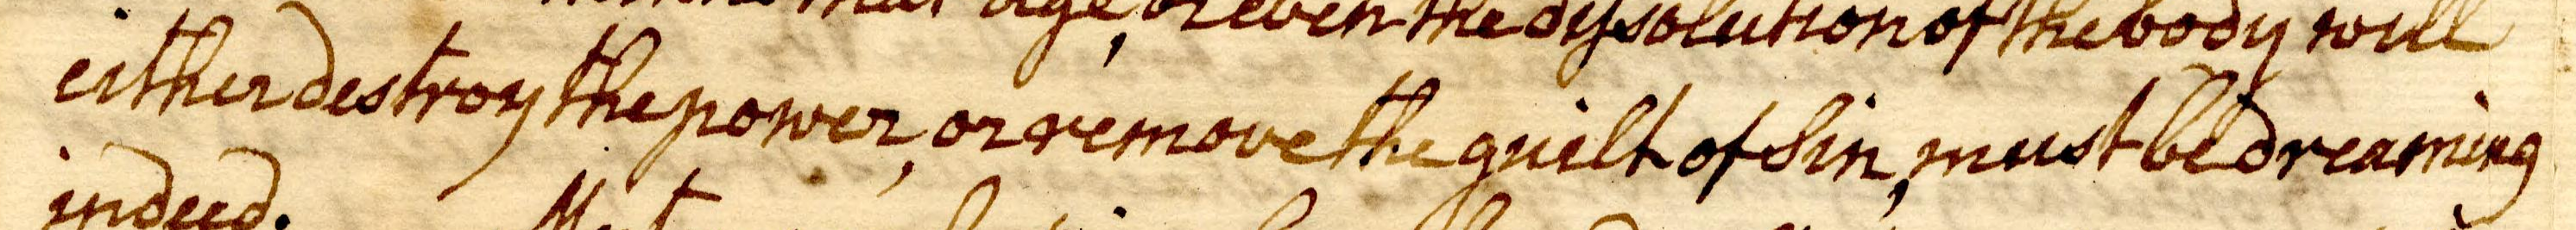either destroy the power, or remove the guilt of sin, must be dreaming
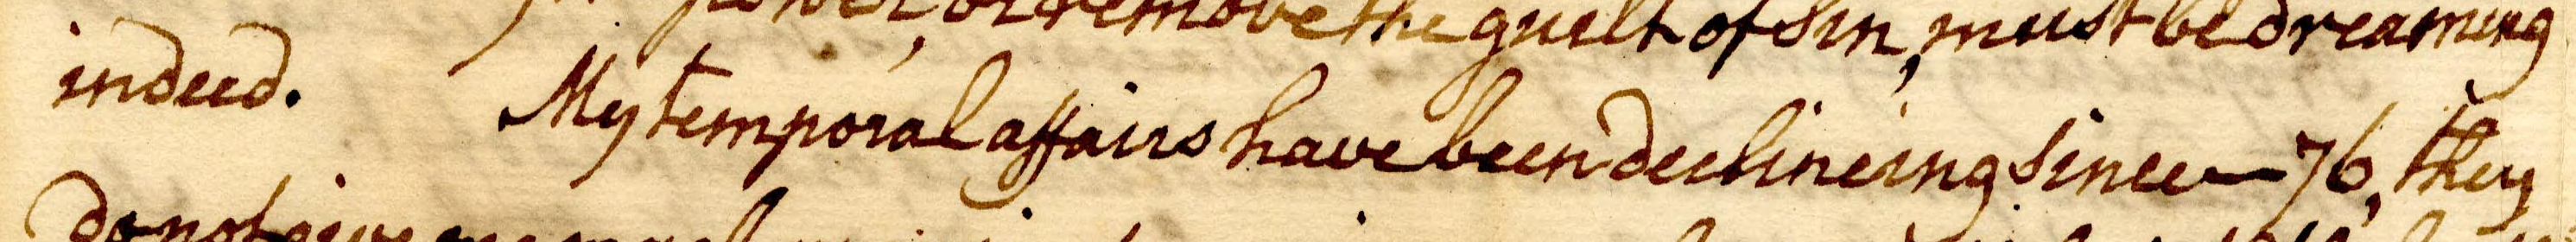indeed. My temporal affairs have been declining since- 76, they
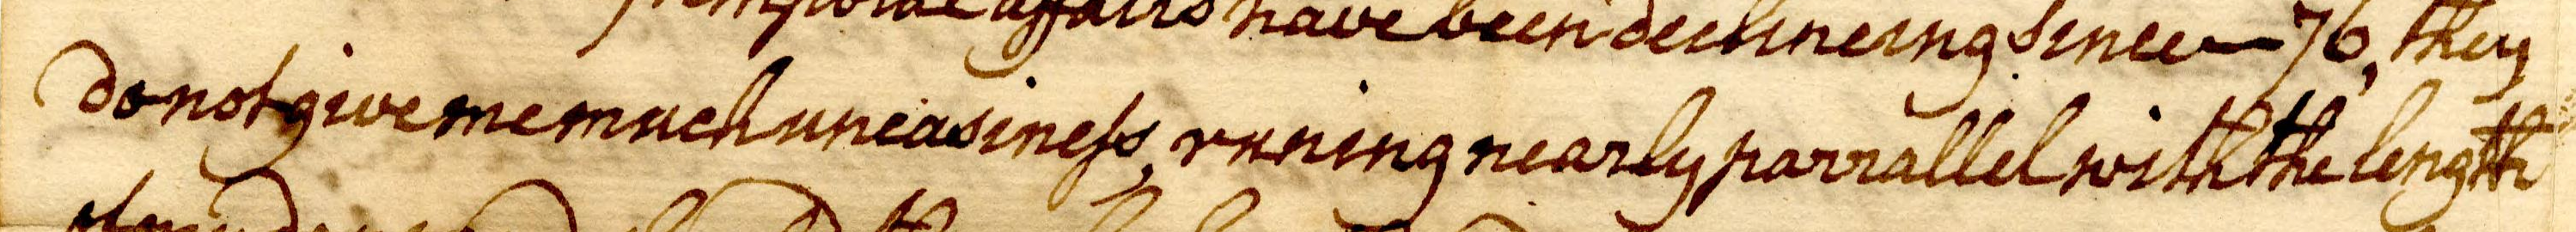do not give me much uneasiness, runing nearly parrallel with the length
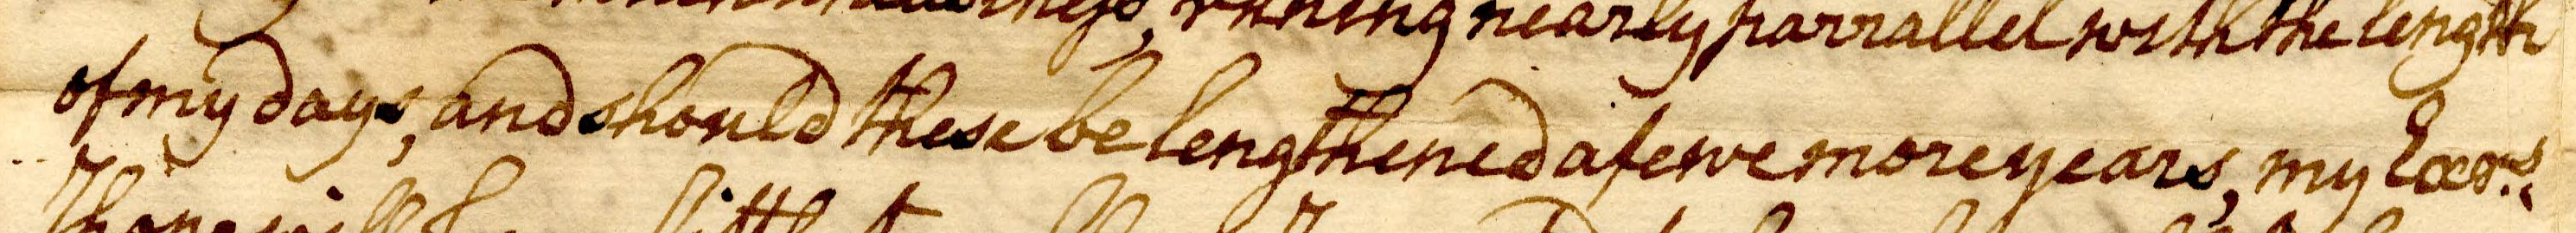of my days, and should these be lengthened a fewe more years, my Exo^s.
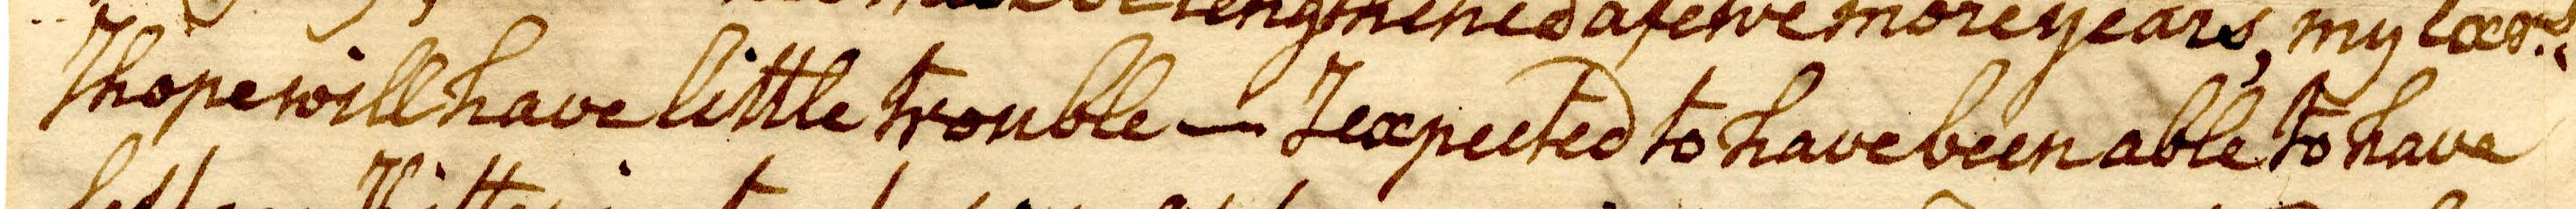I hope will have little trouble- I expected to have been able to have
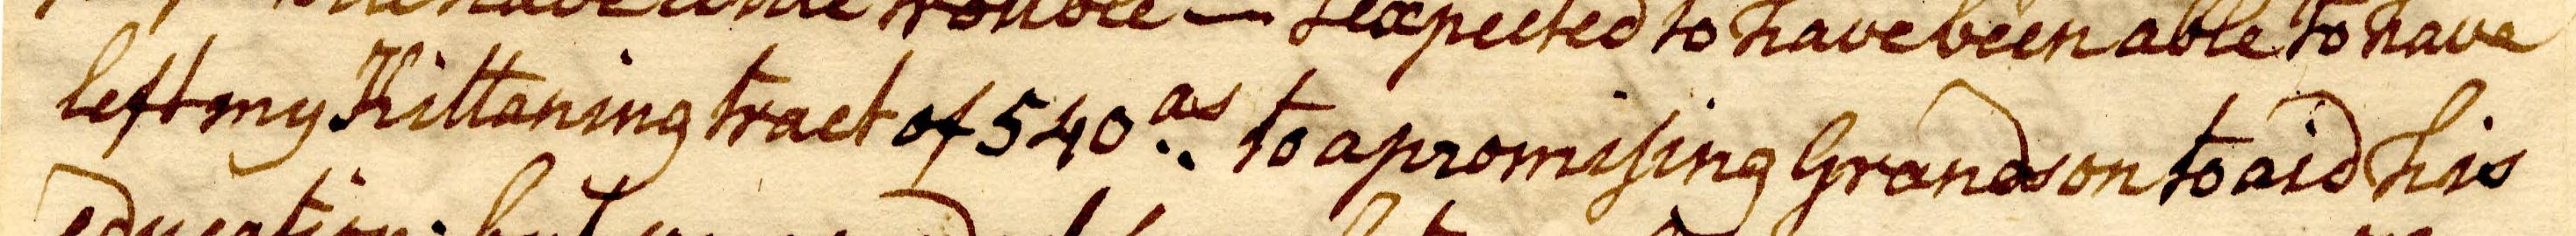left my Kittaning tract of 540^as: to a promising Grandson to aid his
